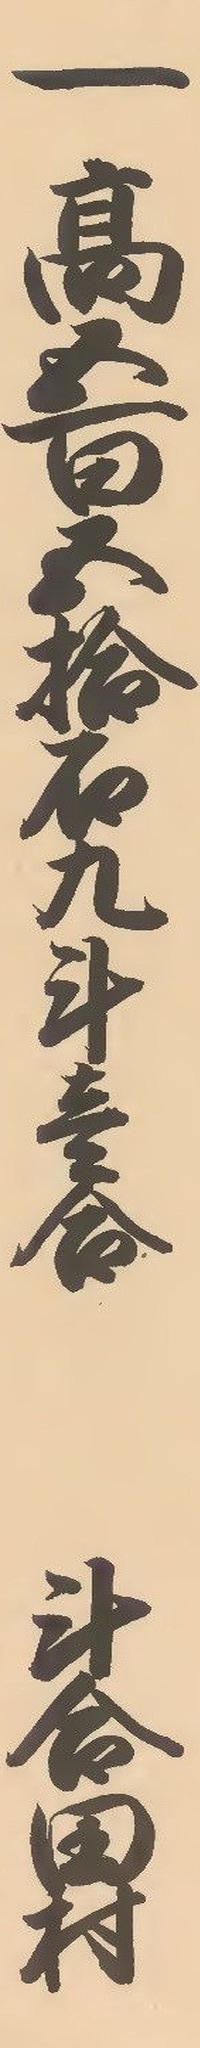一髙五百五拾石九斗壱合斗合田村
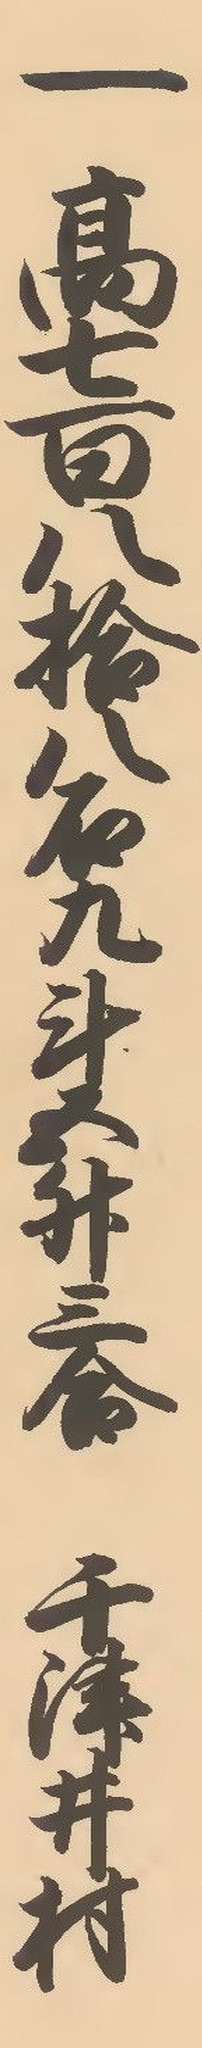一髙七百八拾八石九斗五升三合千津井村

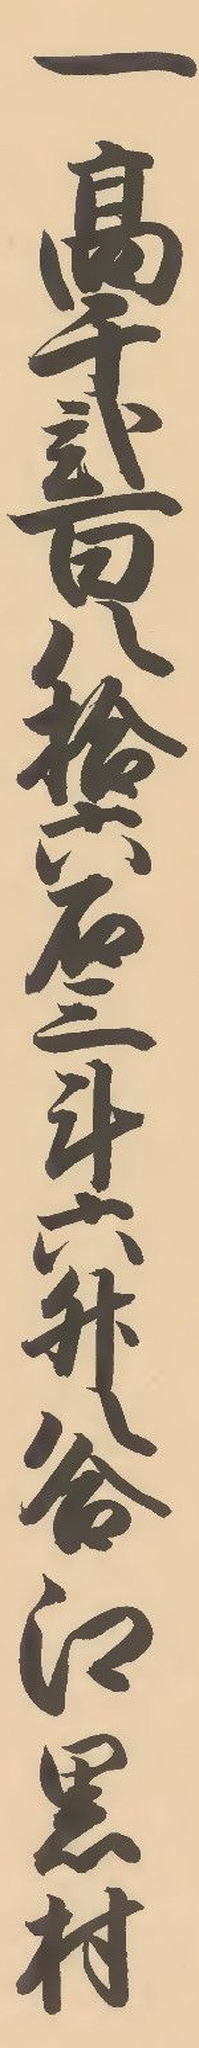一髙千弐百八拾六石三斗六升八合江黑村
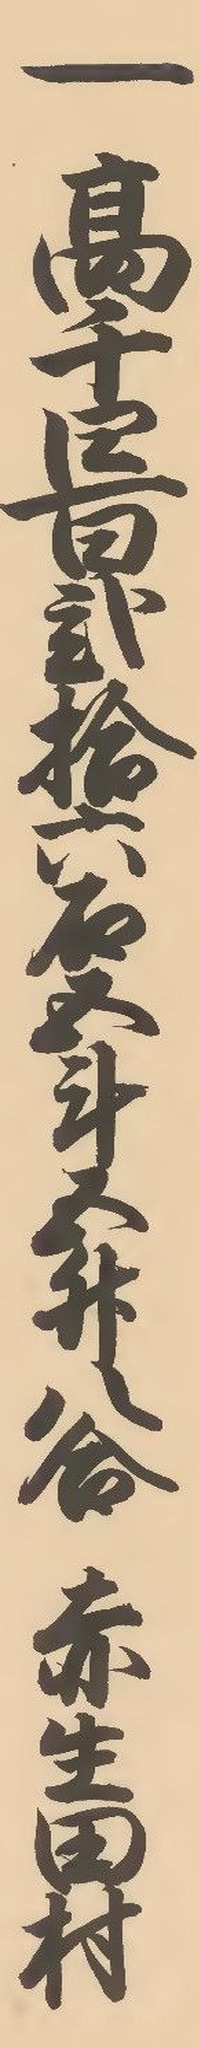一髙千四百弐拾六石五斗五升八合赤生田村
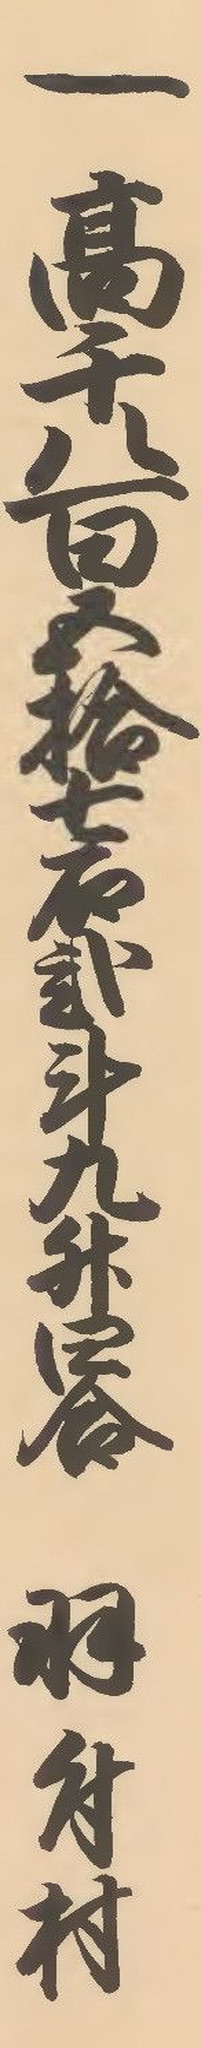一髙千八百五拾七石弐斗九升四合羽付村
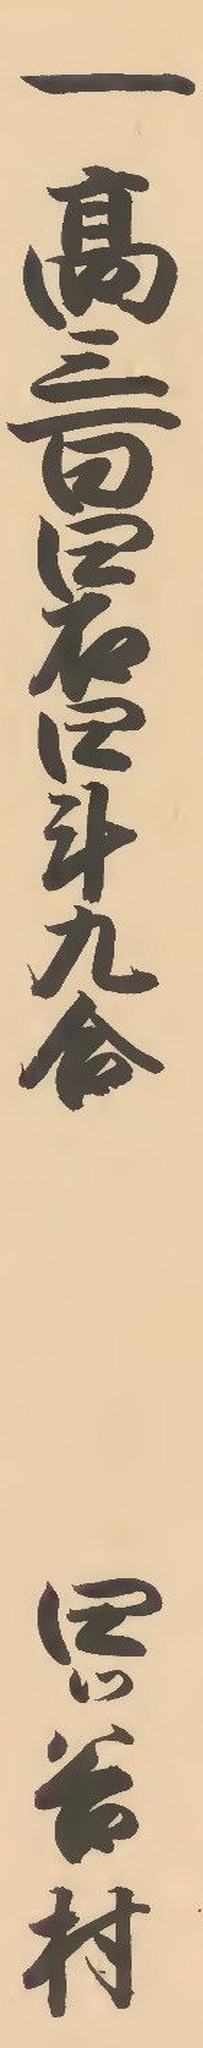一髙三百四石四斗九合四ツ谷村
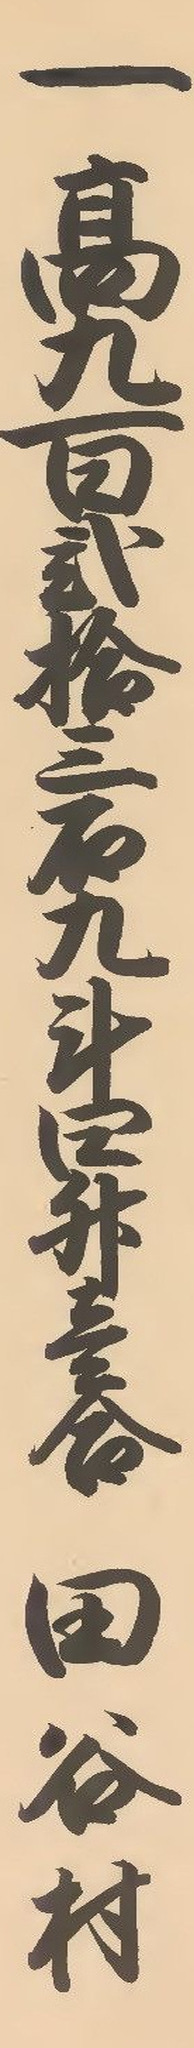一髙九百弐拾三石九斗四升壱合田谷村
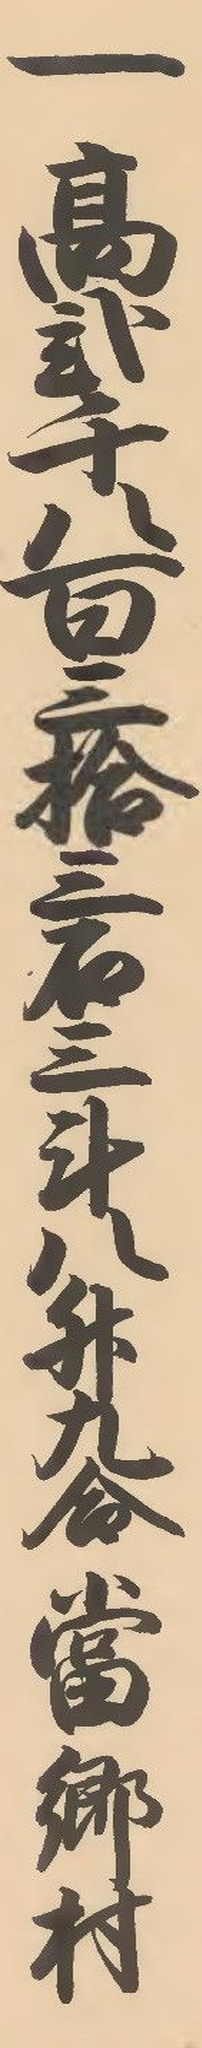一髙弐千八百三拾三石三斗八升九合當郷村
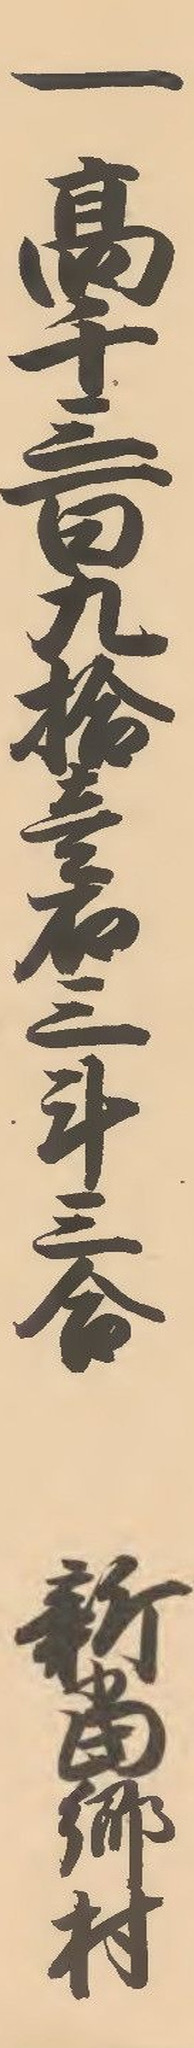一髙千三百九拾壱石三斗三合新當郷村
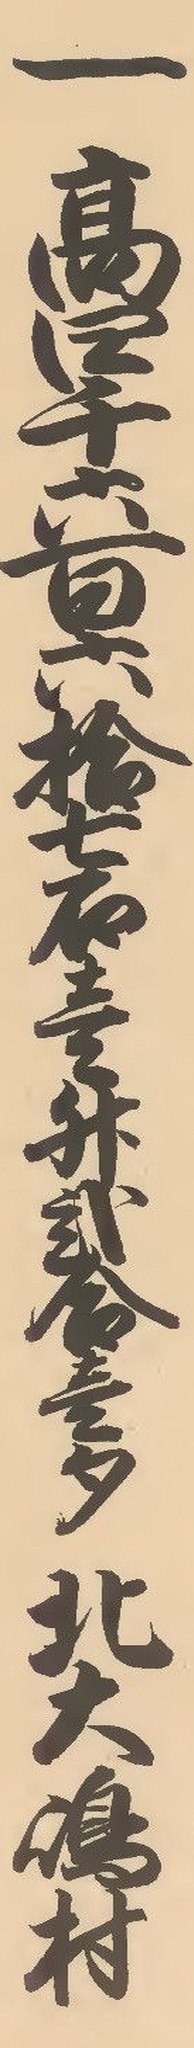一髙四千六百六拾七石壱升弐合壱夕北大嶋村

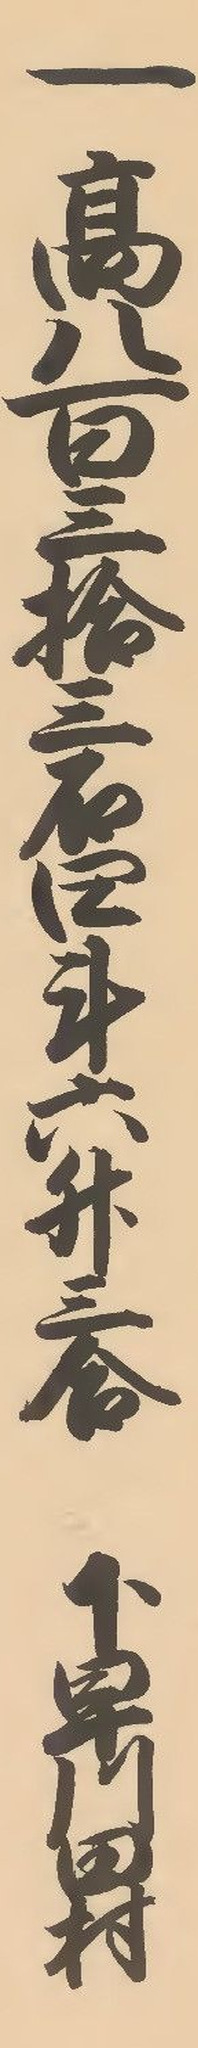一髙八百三拾三石四斗六升三合下早川田村
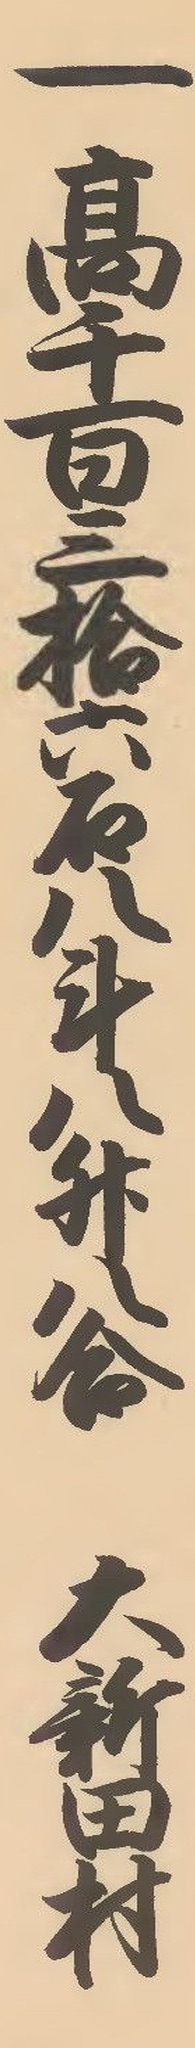一髙千百三拾六石八斗八升八合大新田村
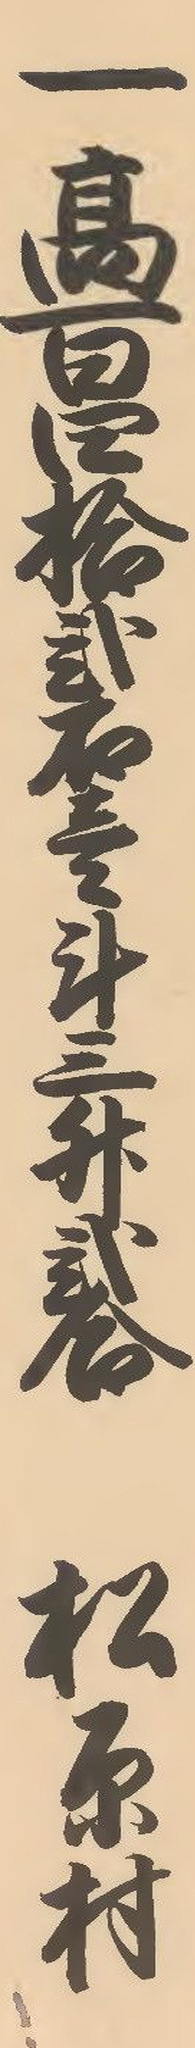一髙百四拾弐石壱斗三升弐合松原村
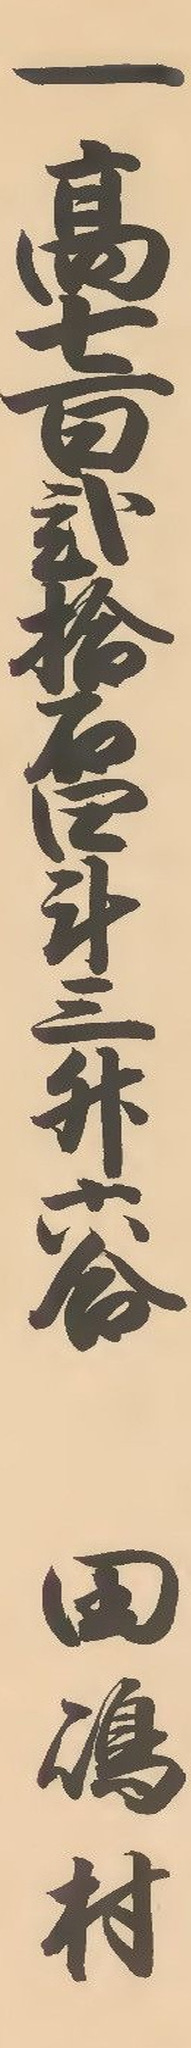一髙七百弐拾石四斗三升六合田嶋村
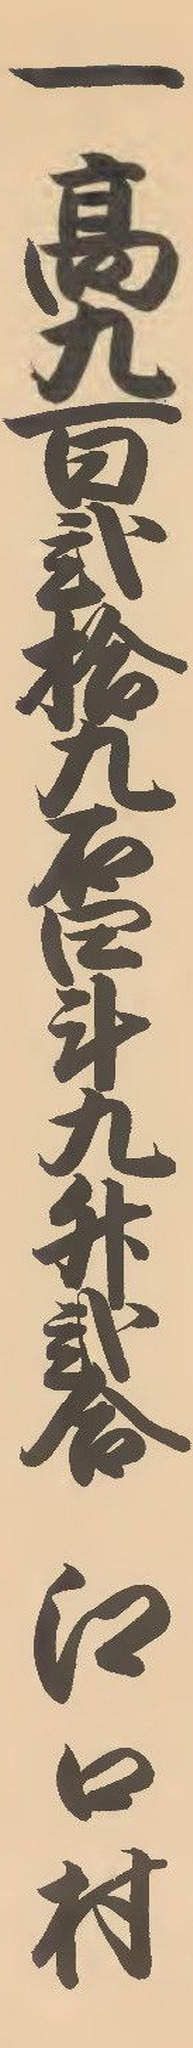一髙九百弐拾九石四斗九升弐合江口村
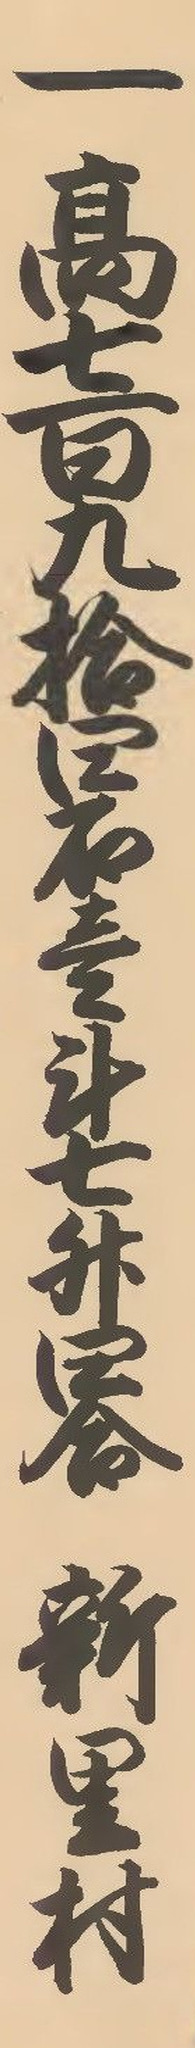一髙七百九拾四石壱斗七升四合新里村
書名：上野国郷帳
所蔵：国立公文書館 National Archives of Japan
